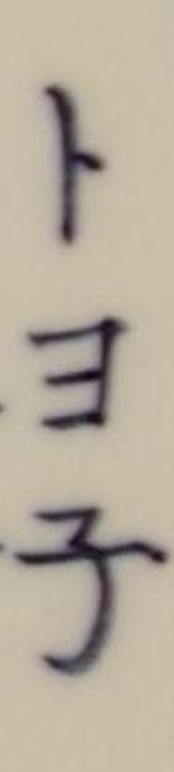トヨ子
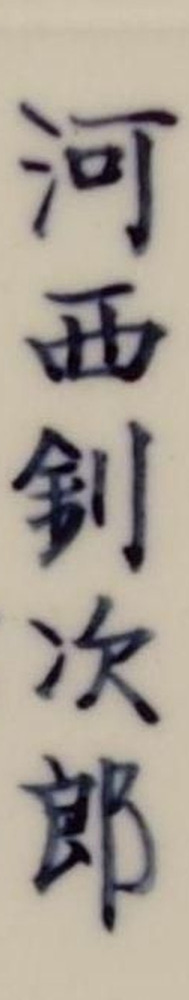河西釗次郎
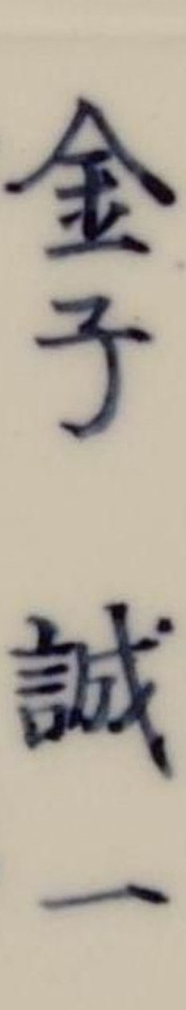金子誠一
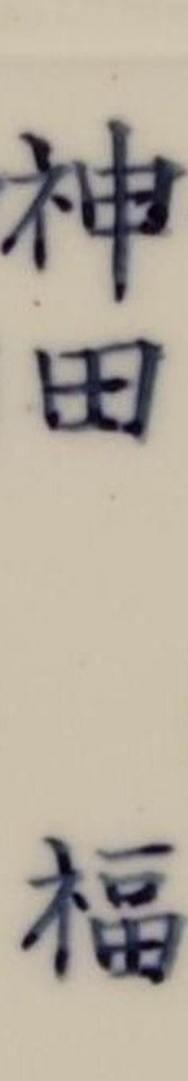神田福
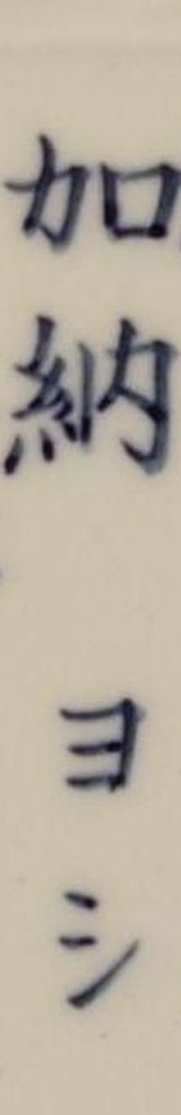加納ヨシ
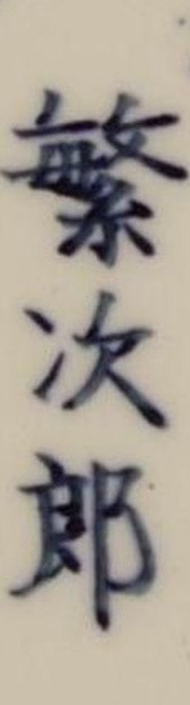繁次郎
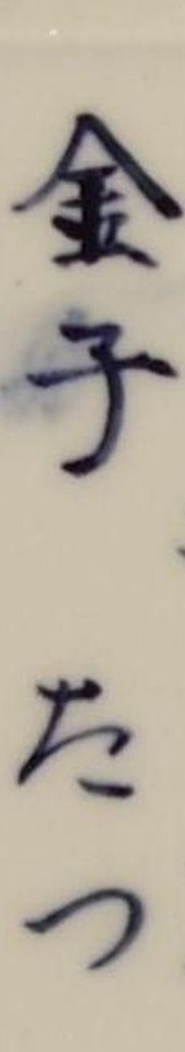金子たつ
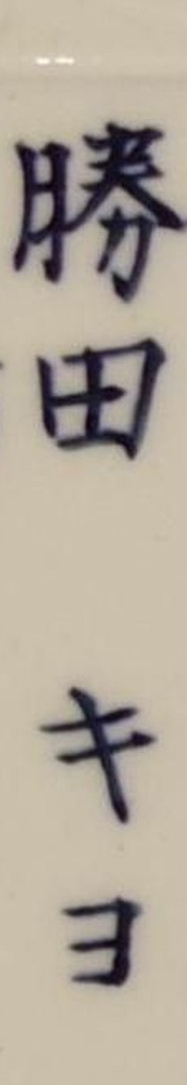勝田キヨ
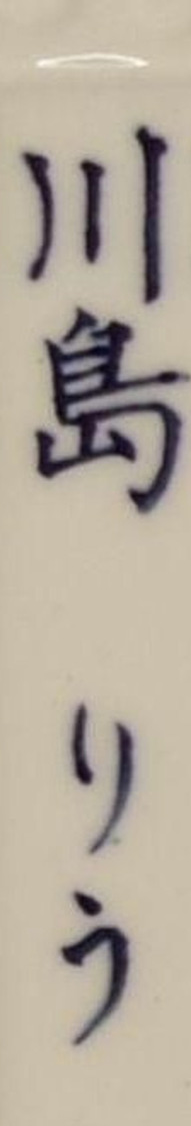川島りう

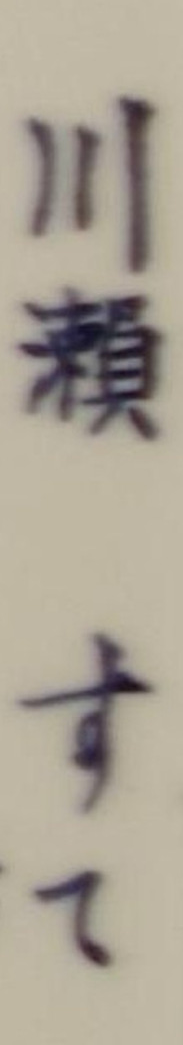川瀬すて
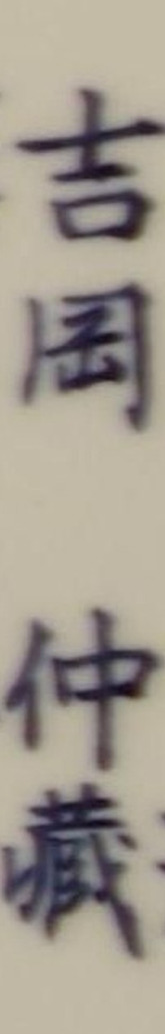吉岡仲蔵
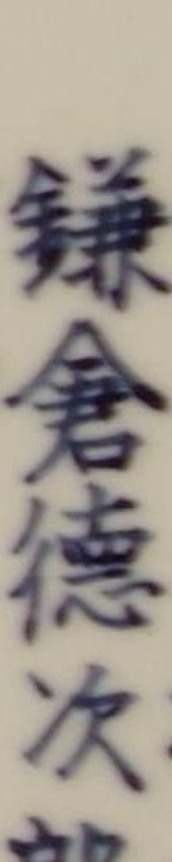鎌倉徳次郎
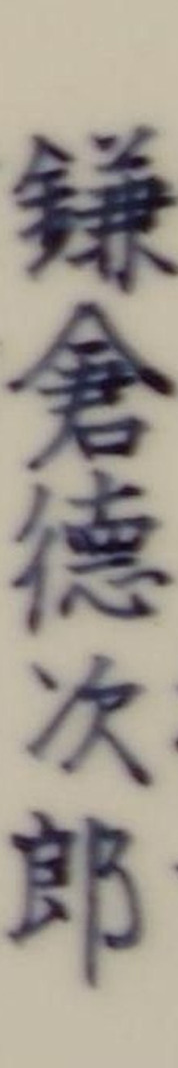鎌倉徳次郎
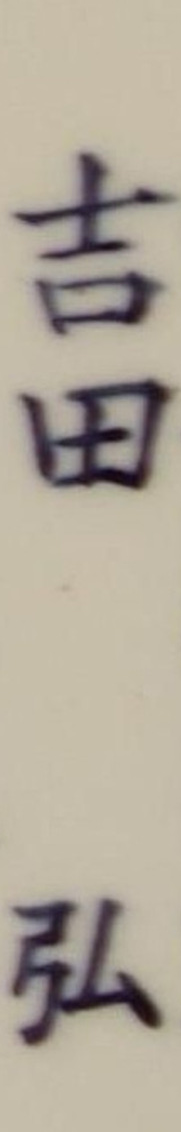吉田弘
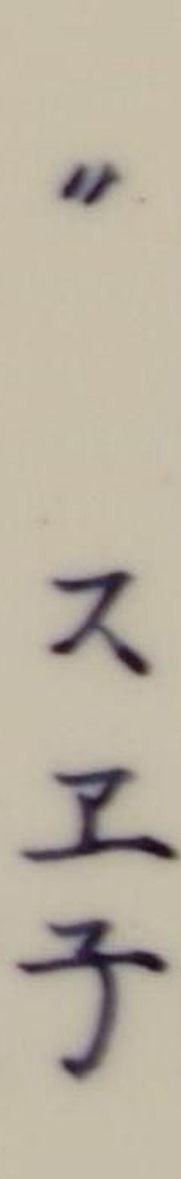スエ子
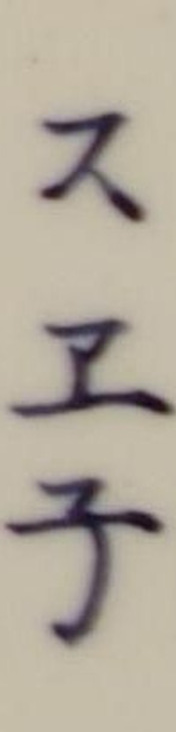スエ子
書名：E~L
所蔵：高野山金剛峯寺
